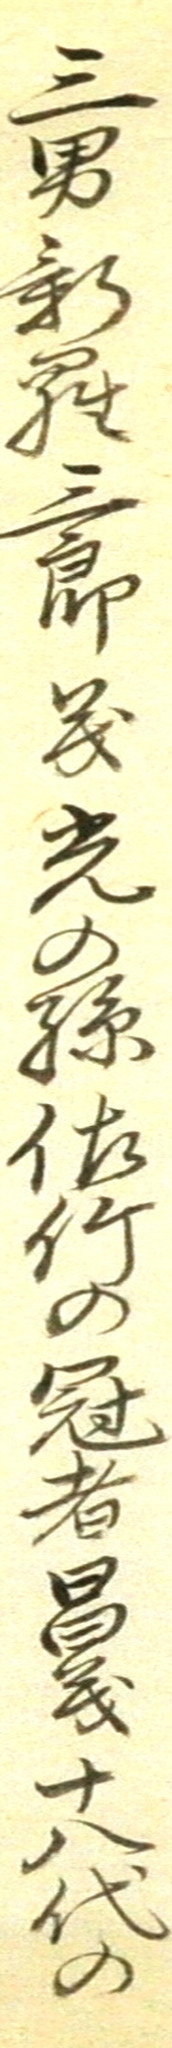三男新羅三郎茂光の孫佐竹の冠者昌義十八代の
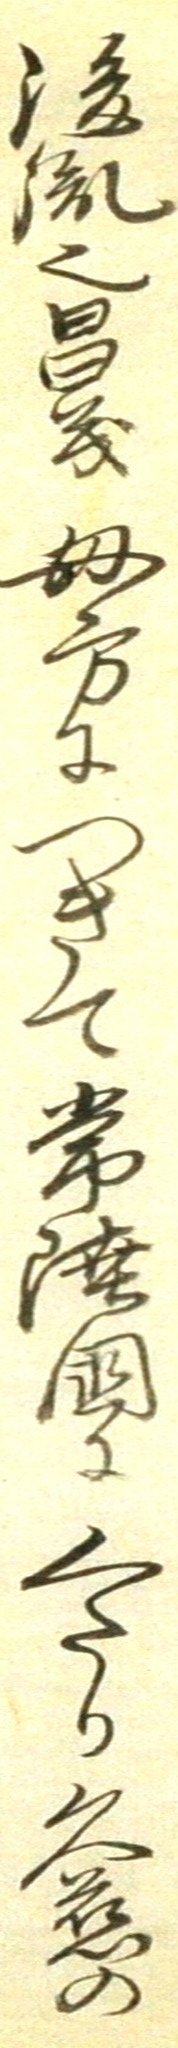後胤也昌義母方につきて常陸国にくたり久慈の
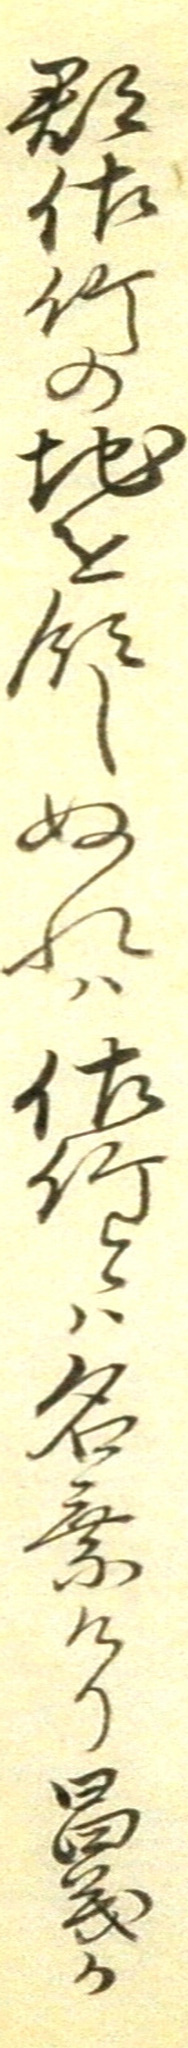郡佐竹の地を領しぬれは佐竹とは名乗けり昌義か
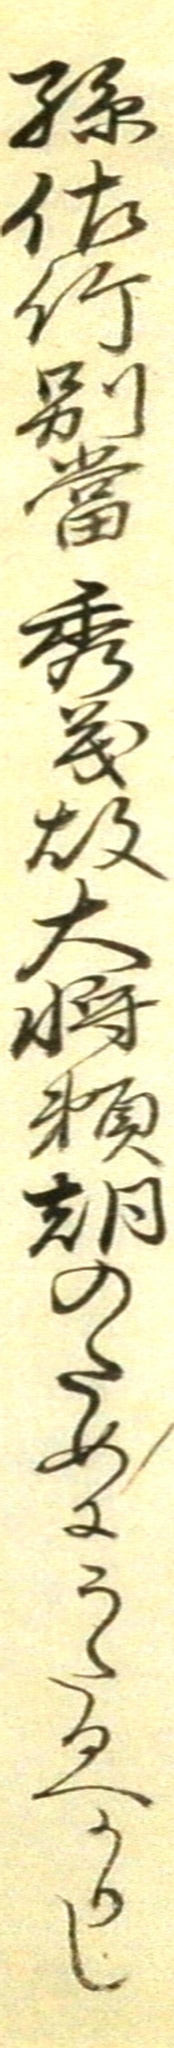孫佐竹別当秀義故大将頼朝のためにうたるへかりし
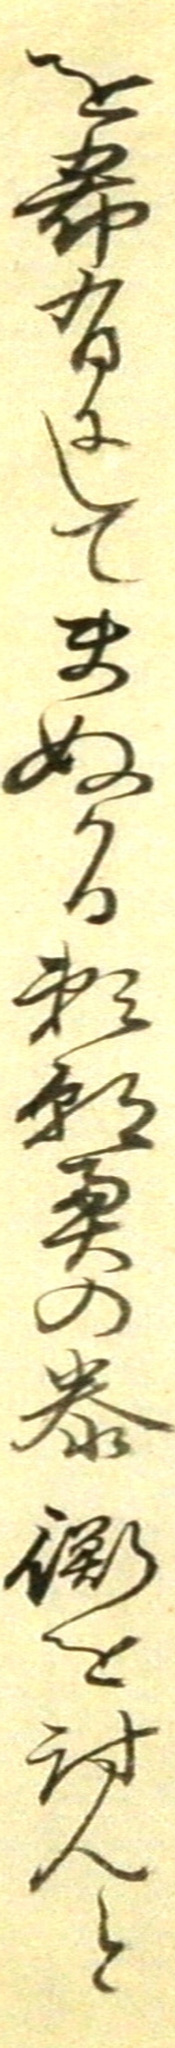を希有にしてまぬかる頼朝奥の泰衡を討んと
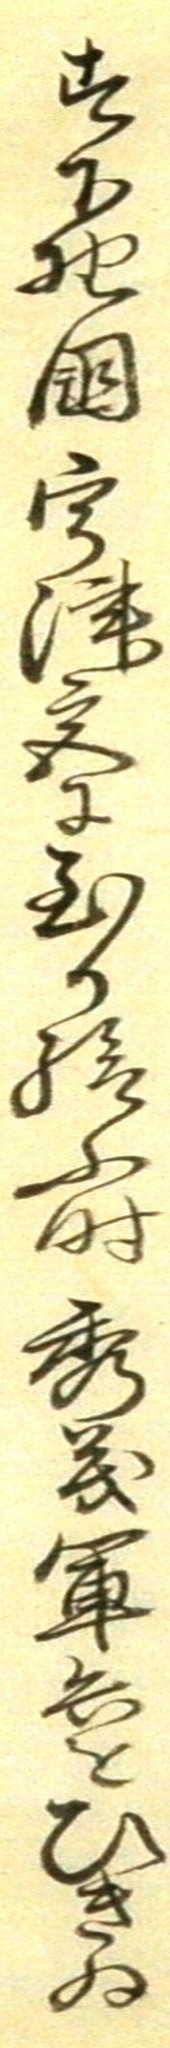す下野国宇津宮に至り給ふ時秀義軍兵をひきゐ
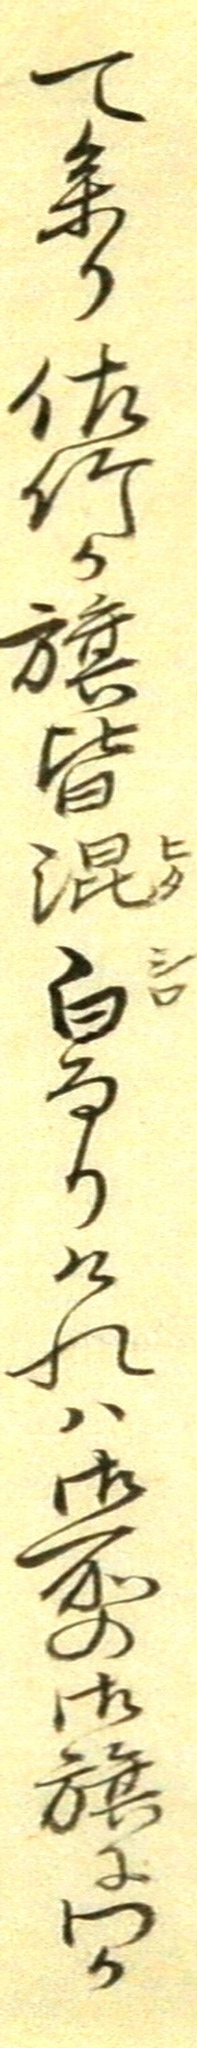て参り佐竹か旗皆混白なりけれは御所の御旗にわか
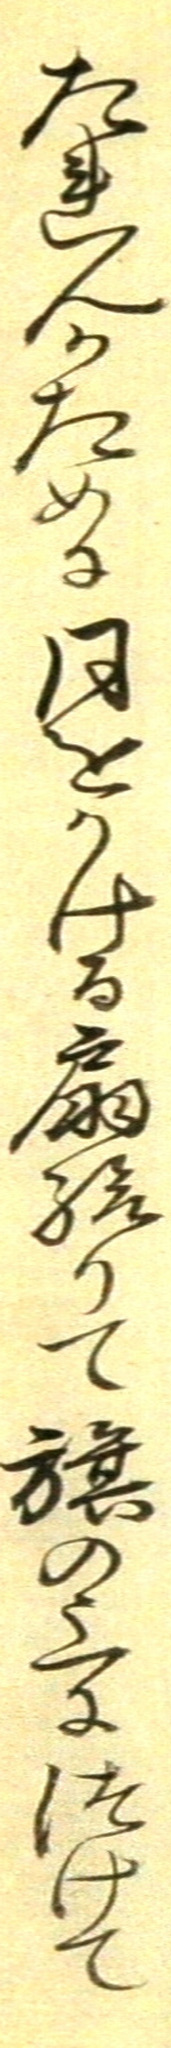たれんかために月をかける扇給りて旗の上につけて

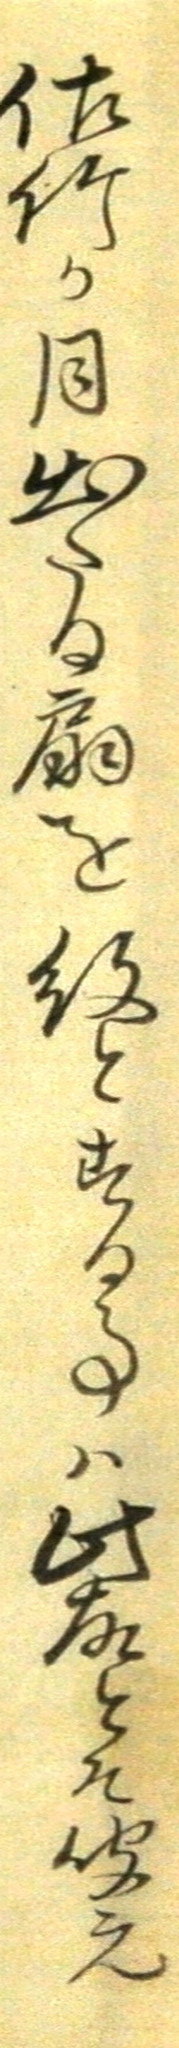佐竹か月出たる扇を紋とする事は此故とそ聞え
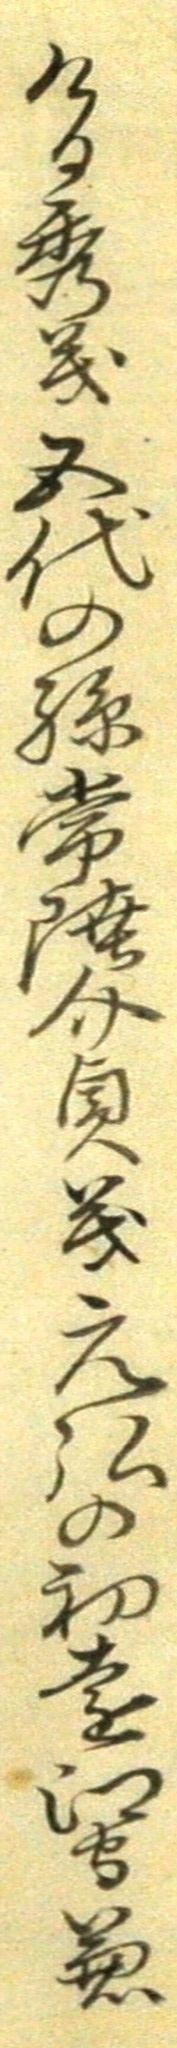ける秀義五代の孫常陸介貞義元弘の初遠江守兼
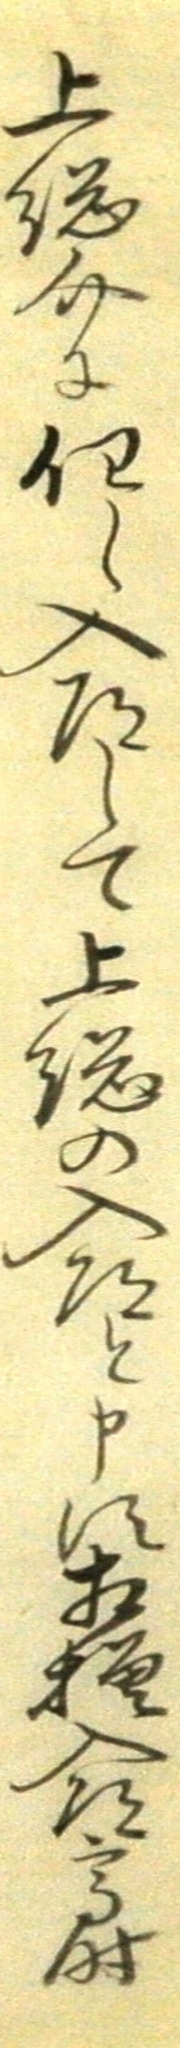上総介に任し入道して上総の入道と申す相模入道高時
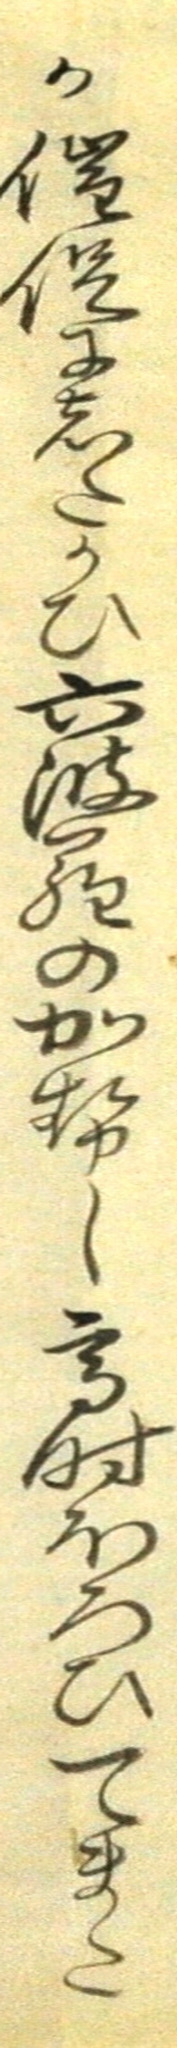か催促にしたかひ六波羅の加勢し高時ほろひてまた
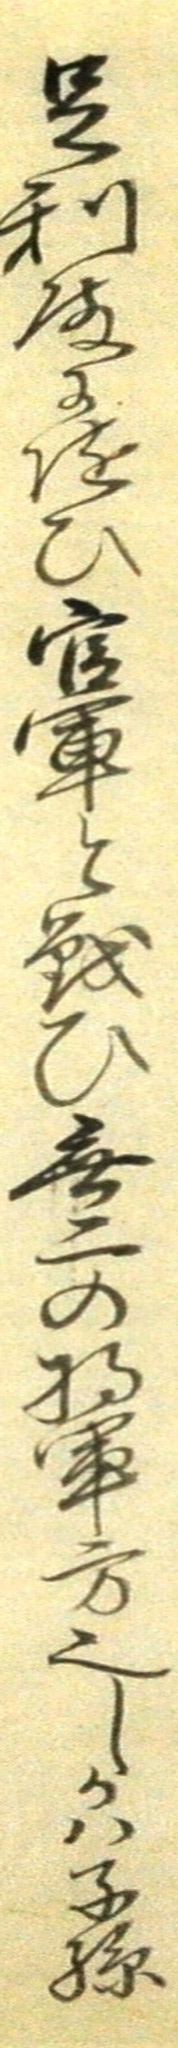足利殿に随ひ官軍と戦ひ無二の将軍方也しかは子孫
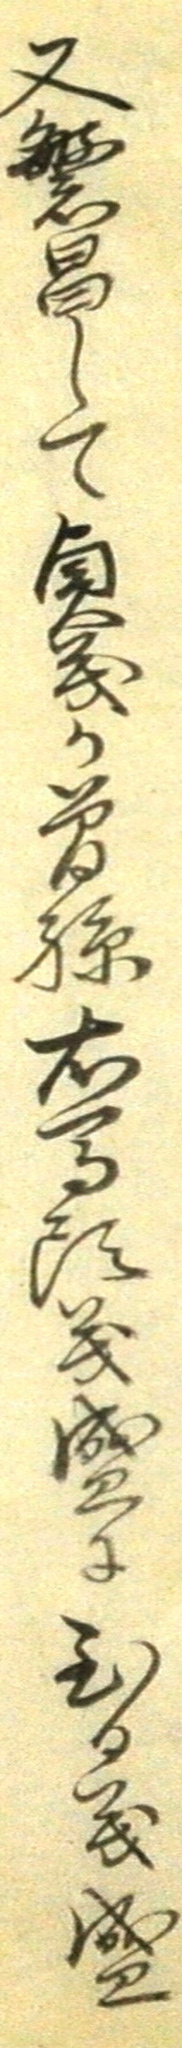亦繁昌して貞義か曽孫右馬頭義盛に至る義盛
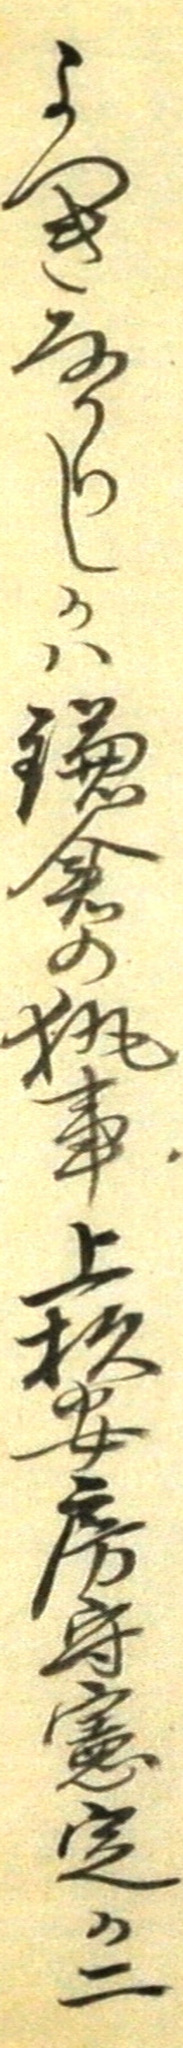よつきなかりしかは鎌倉の執事上杉安房守憲定か二
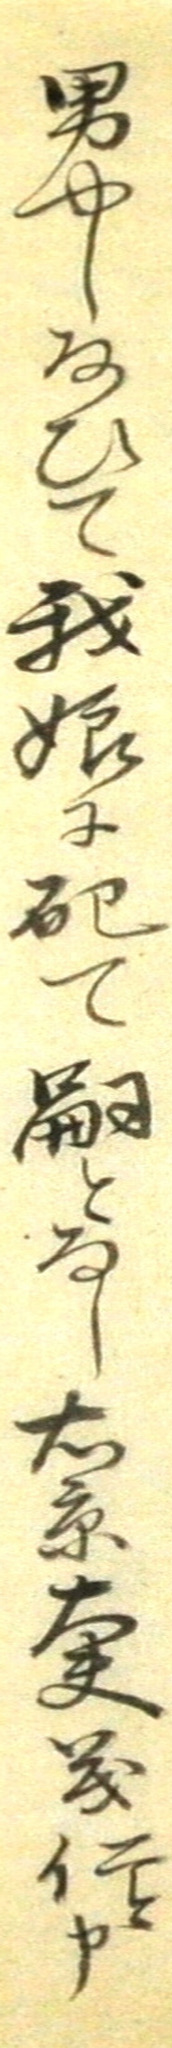男やしなひて我娘に配て嗣となし右京大夫義仁と申
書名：藩翰譜（八・下）
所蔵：伊那市立高遠町図書館・合同会社AMANE
